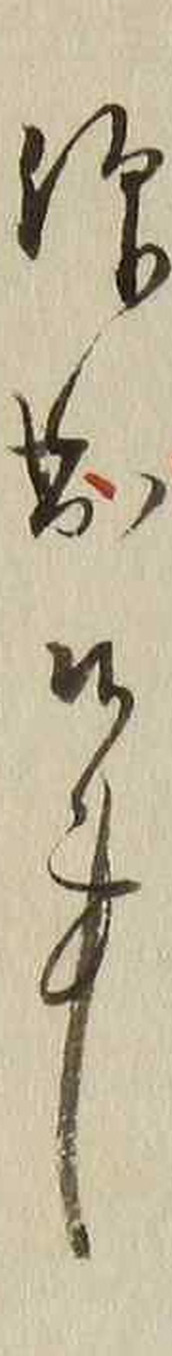仰出候事
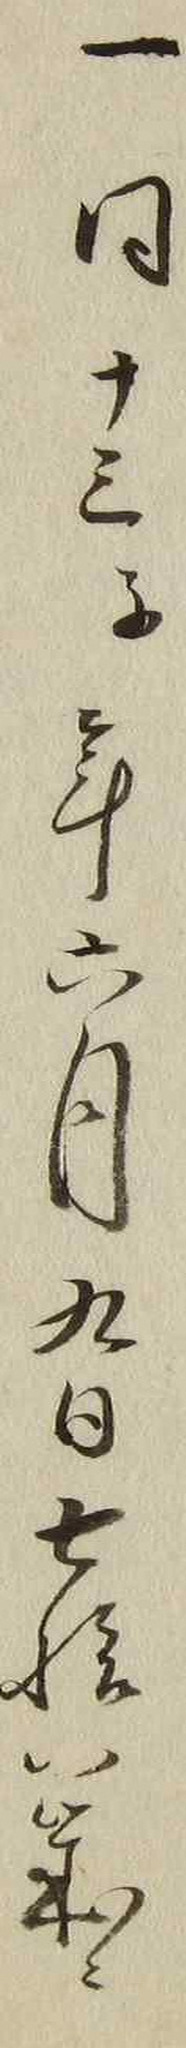一同十三子年六月九日七拾八歳ニ
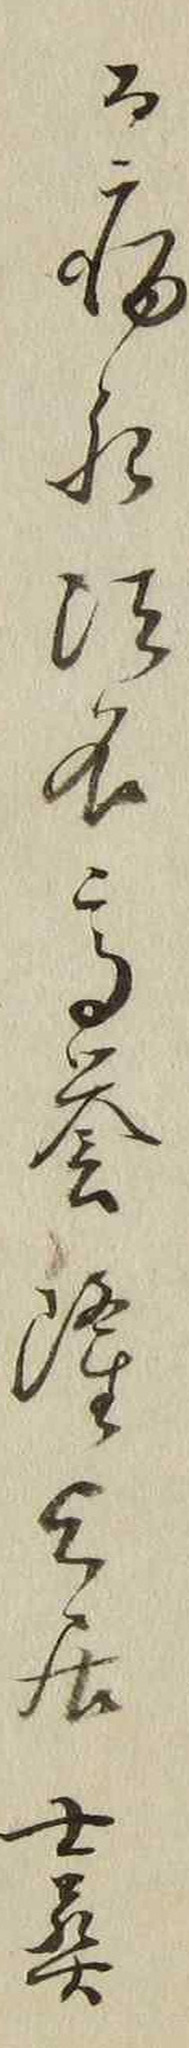而病死法名高誉隆与居士葬
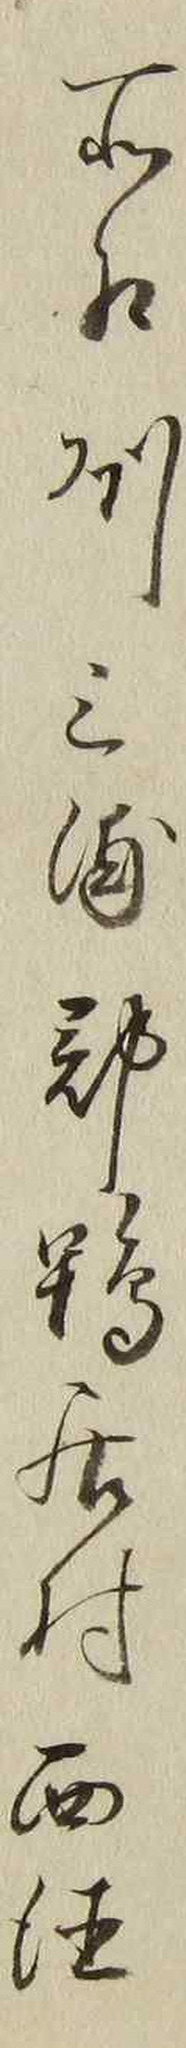所相州三浦郡鴨居村西徳
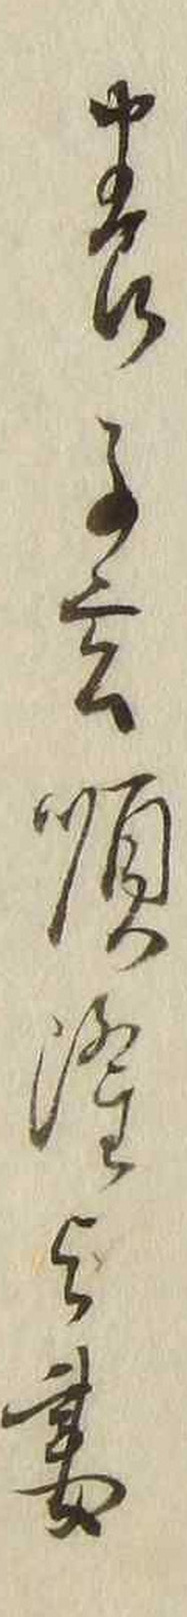女養子玄順隆与妻

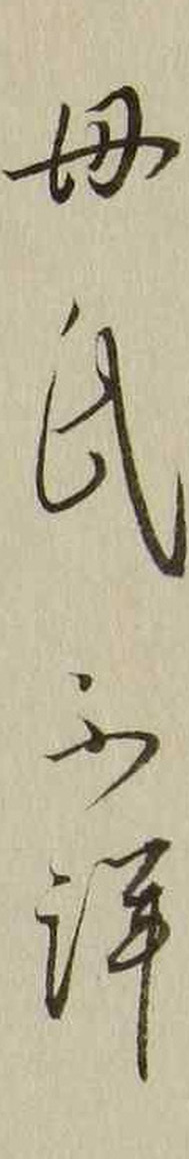母氏不詳
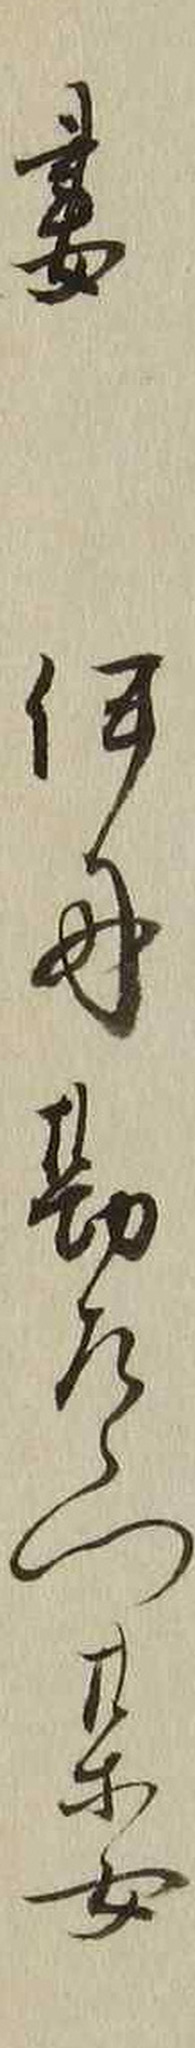妻伊丹勘左衛門某女
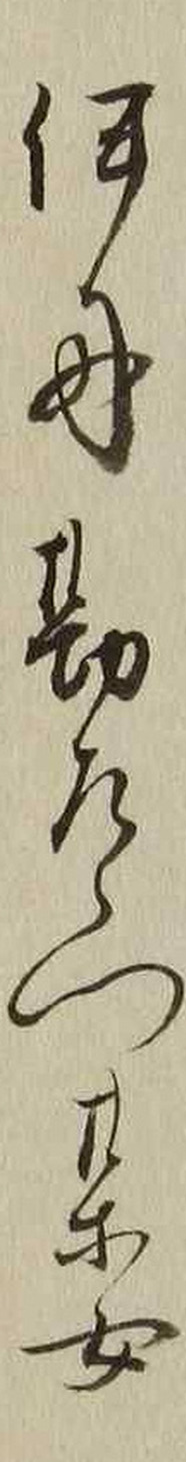妻伊丹勘左衛門某女
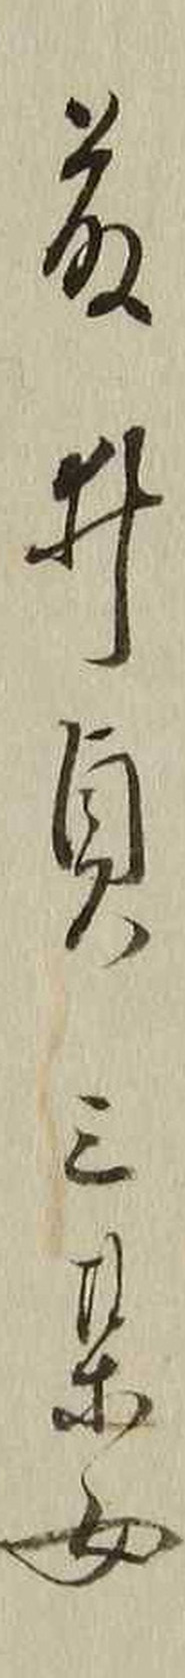藤井貞三某女
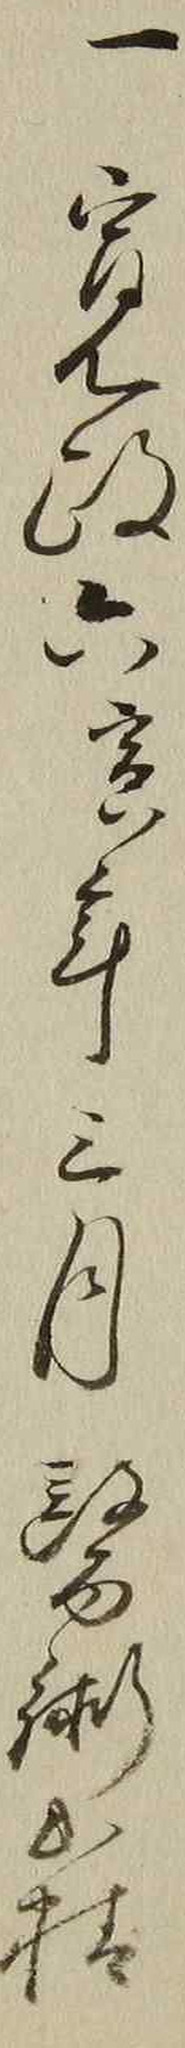一寛政六寅年三月医術出精
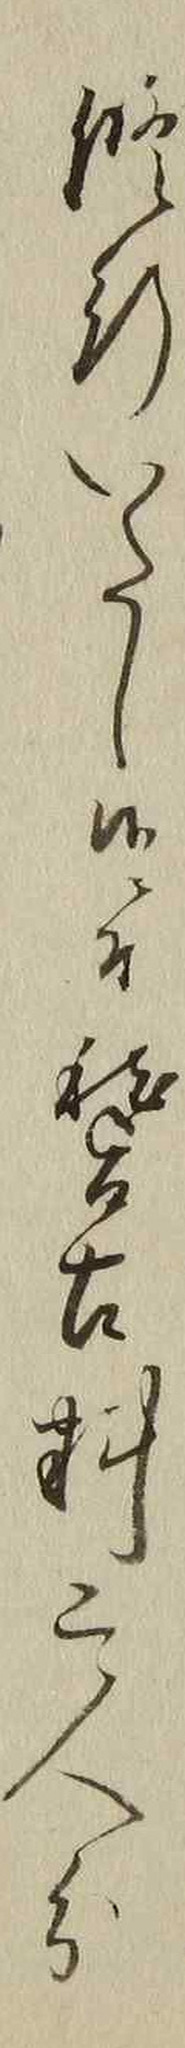修行いたし候ニ付稽古料二人分
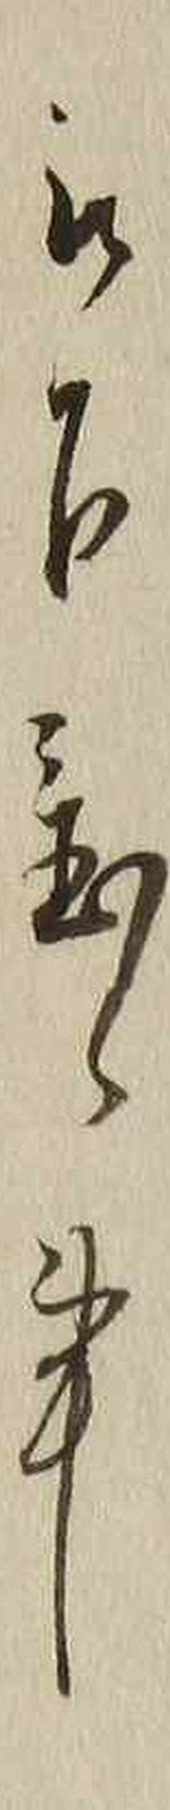被下置候事
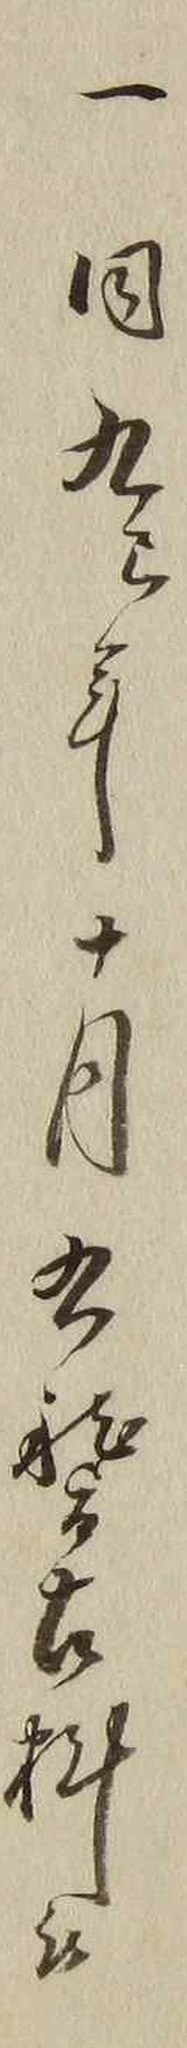一同九巳年十月右稽古料被
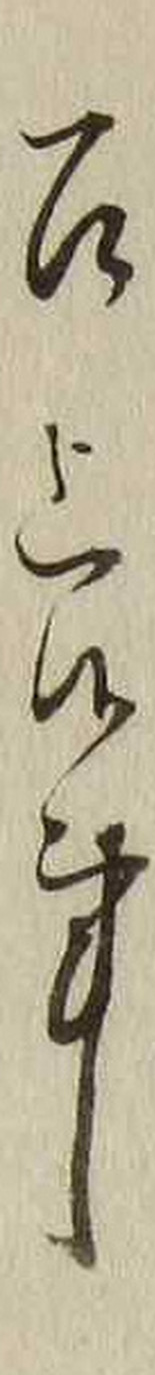召上候事
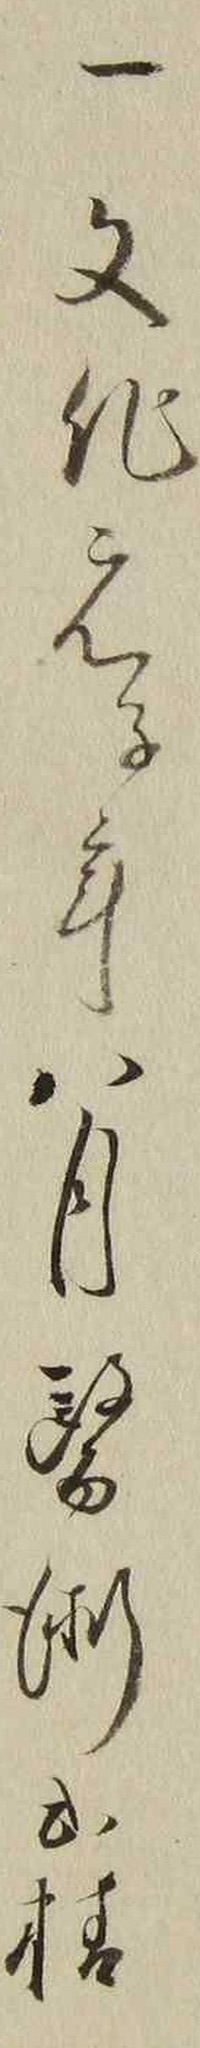一文化元子年八月医術出精
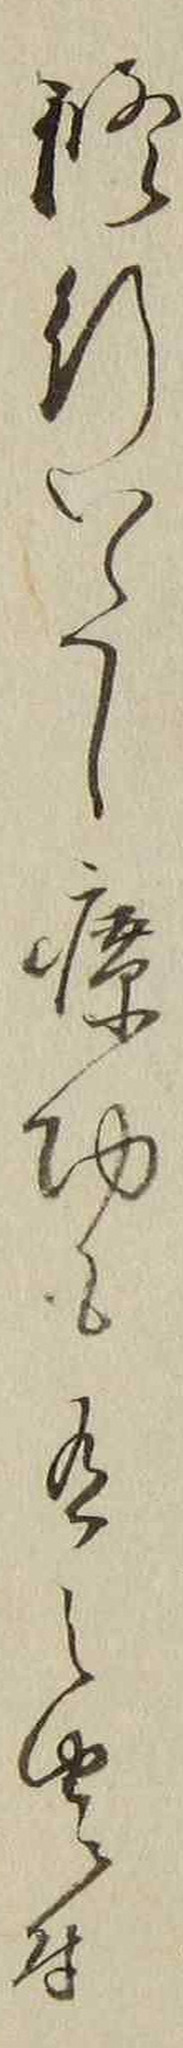修行いたし療功も有之由ニ付
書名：諸士系譜　巻之129　た之部5
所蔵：会津若松市立会津図書館
